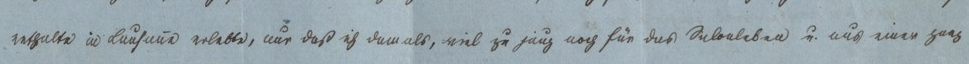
enthalte in Lausanne erlebte, nur daß ich damals, viel zu jung noch für das Salonleben u. aus einer ganz
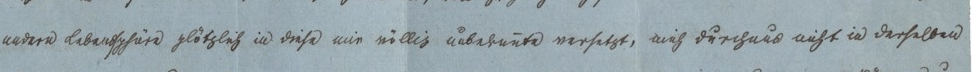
andern Lebenssphäre plötzlich in diese mir völlig unbekannte versetzt, mich durchaus nicht in derselben
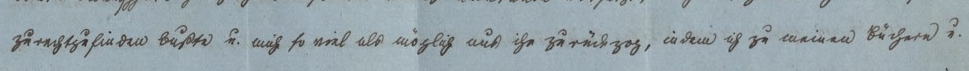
zurechtzufinden wußte u. mich so viel als möglich aus ihr zurückzog, indem ich zu meinen Büchern u.
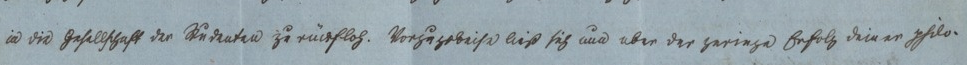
in die Gesellschaft der Studenten zurückfloh. Vorzugsweise ließ sich nun aber der geringe Erfolg deiner philo-
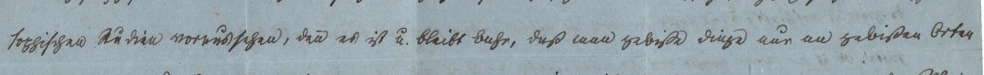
sophischen Studien voraussehen, denn es ist u. bleibt wahr, daß man gewisse Dinge nur an gewißen Orten
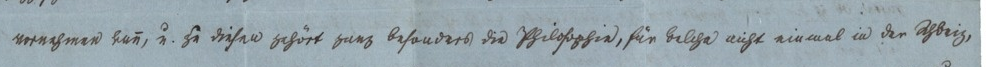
vornehmen kann, u. zu diesen gehört ganz besonders die Philosophie, für welche nicht einmal in der Schweiz,
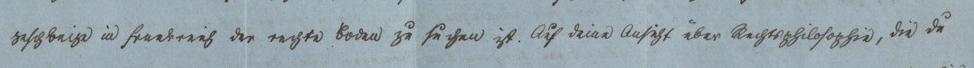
geschweige in Frankreich der rechte Boden zu suchen ist. Auf deine Ansicht über Rechtsphilosophie, die du
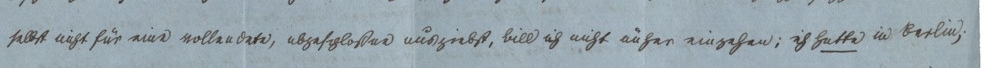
selbst nicht für eine vollendete, abgeschloßne ausgiebst, will ich nicht näher eingehen; ich hatte in Berlin;
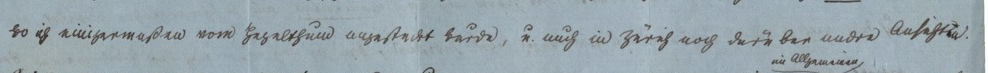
wo ich einigermaßen vom Hegelthum angesteckt wurde, u. auch in Zürich noch darüber andre Ansichten.
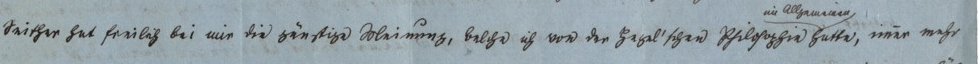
Seither hat freilich bei mir die günstige Meinung, welche ich von der Hegel'schen Philosophie im Allgemeinen hatte,
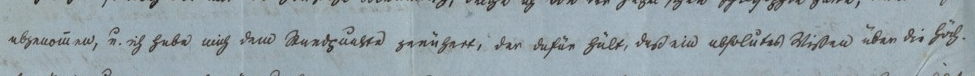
abgenommen, u. ich habe mich dem Standpunkte genähert, der dafür hält, daß ein absolutes Wissen über die höch-
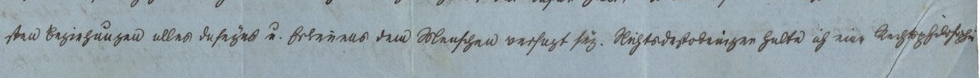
sten Beziehungen alles Daseyns u. Erkennens dem Menschen versagt sey. Nichtsdestoweniger halte ich eine Rechtsphilosophie
